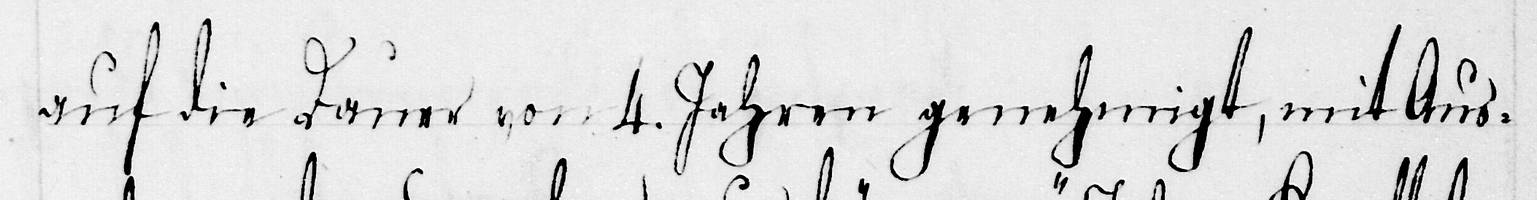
auf die Dauer von 4. Jahren genehmigt, mit Aus¬
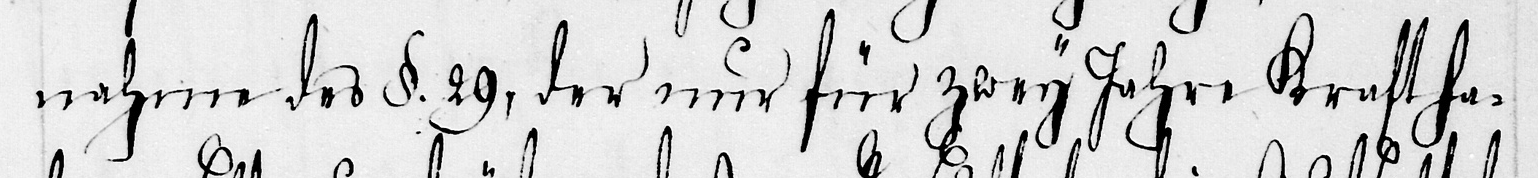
nahme des §. 29., der nur für zwey Jahre Kraft ha¬
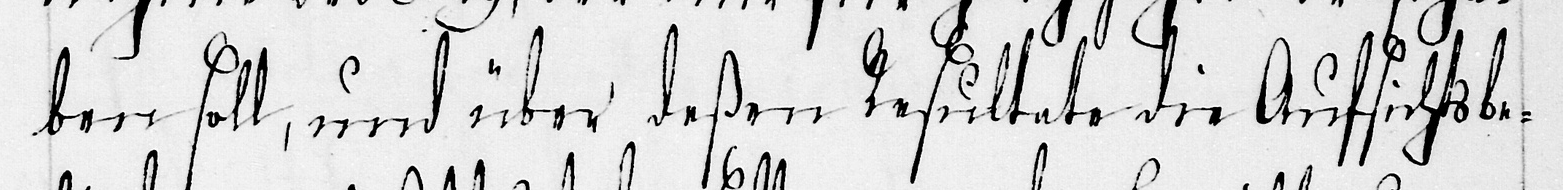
ben soll, und über deßen Resultate die Aufsichtsbe¬
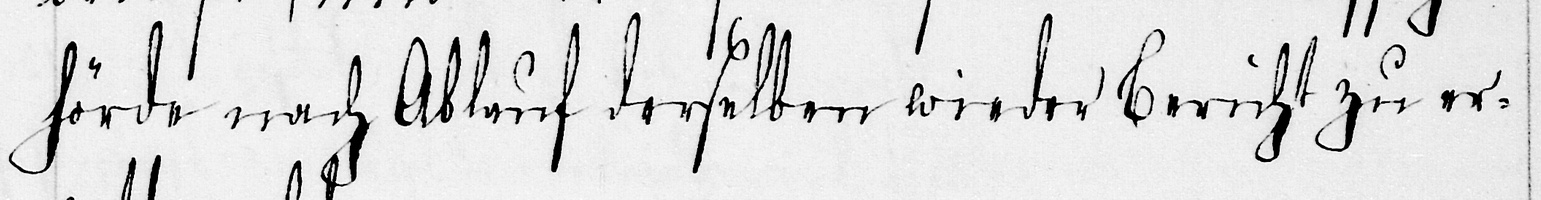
hörde nach Ablauf derselben wieder Bericht zu er¬
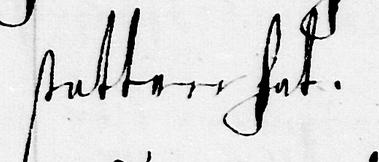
statten hat.
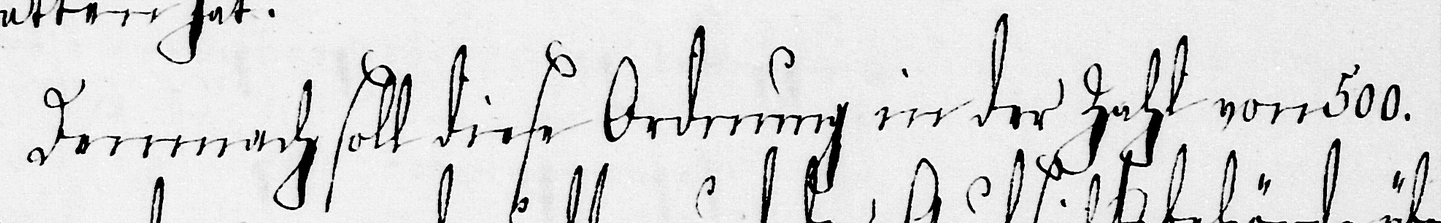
Demnach soll diese Ordnung in der Zahl von 500.
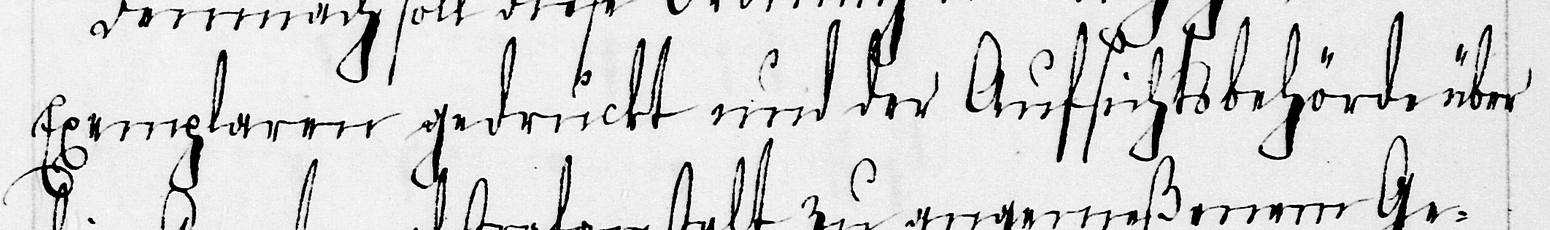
Exemplaren gedruckt und der Aufsichtsbehörde über
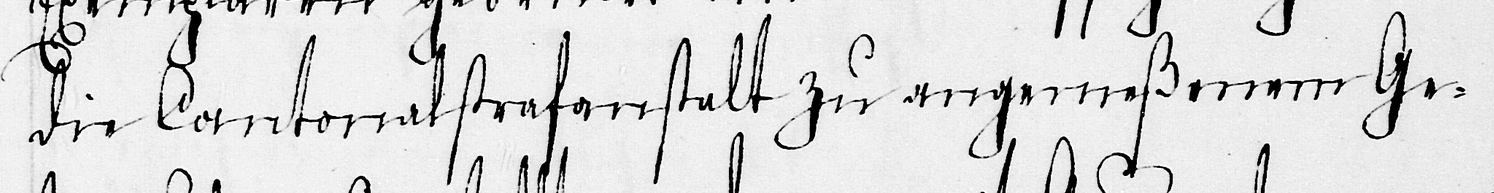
die Cantonalstrafanstalt zu angemeßenem Ge¬
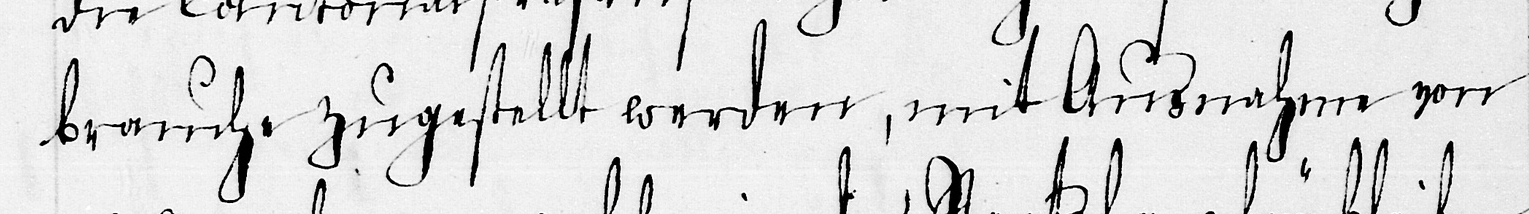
brauche zugestellt werden, mit Ausnahme von
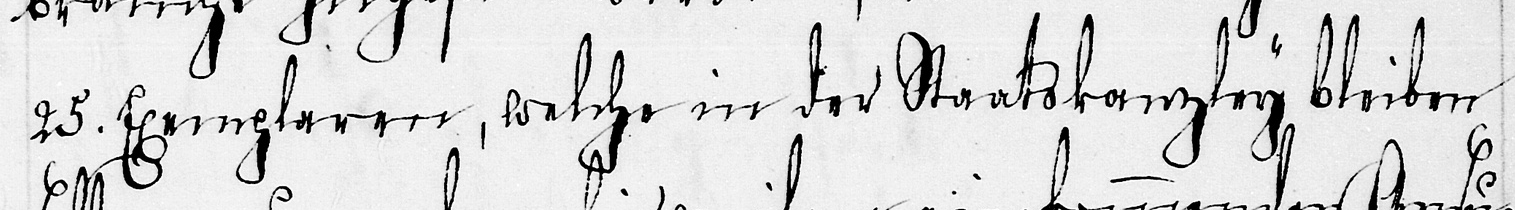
25. Exemplaren, welche in der Staatskanzley bleiben
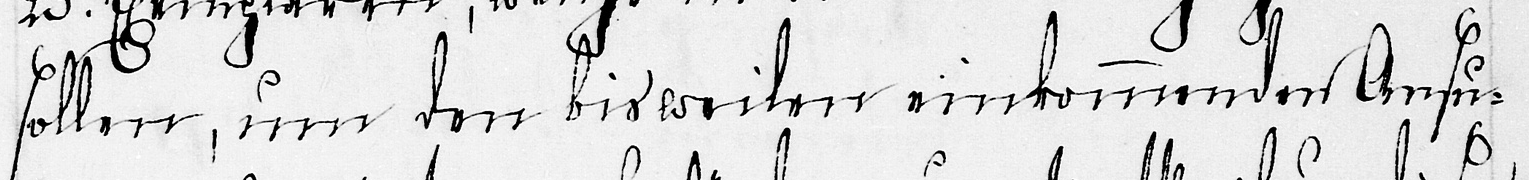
sollen, um den bisweilen einkommenden Ansu¬
